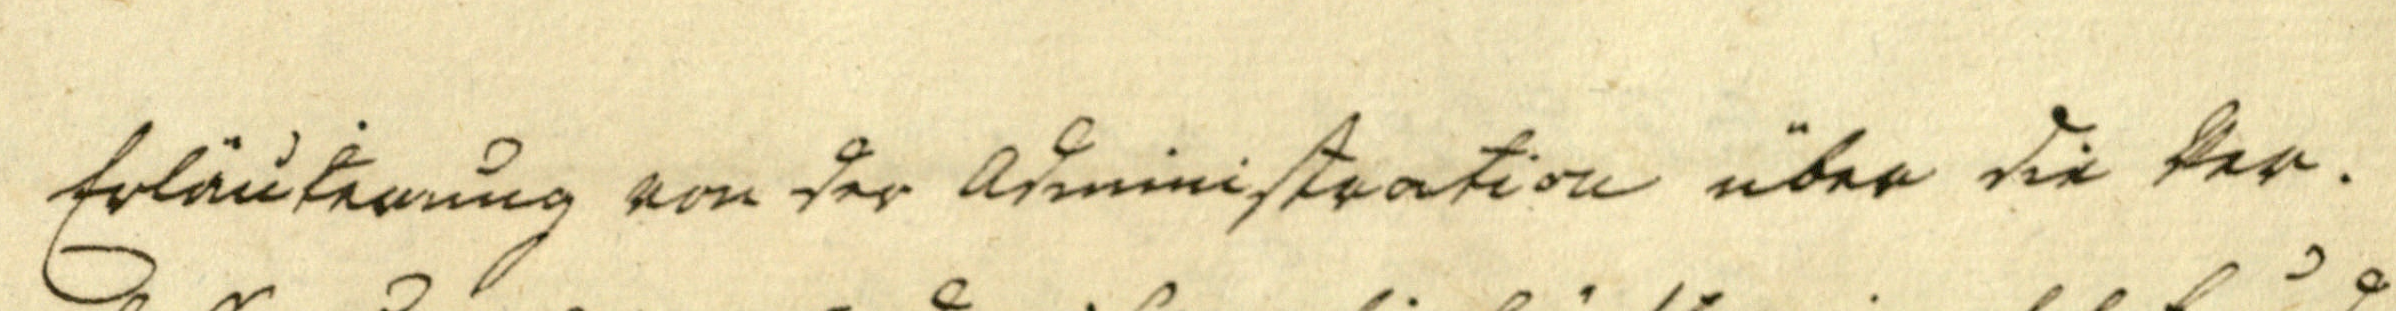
Erläuterung von der Administration über die Ver¬
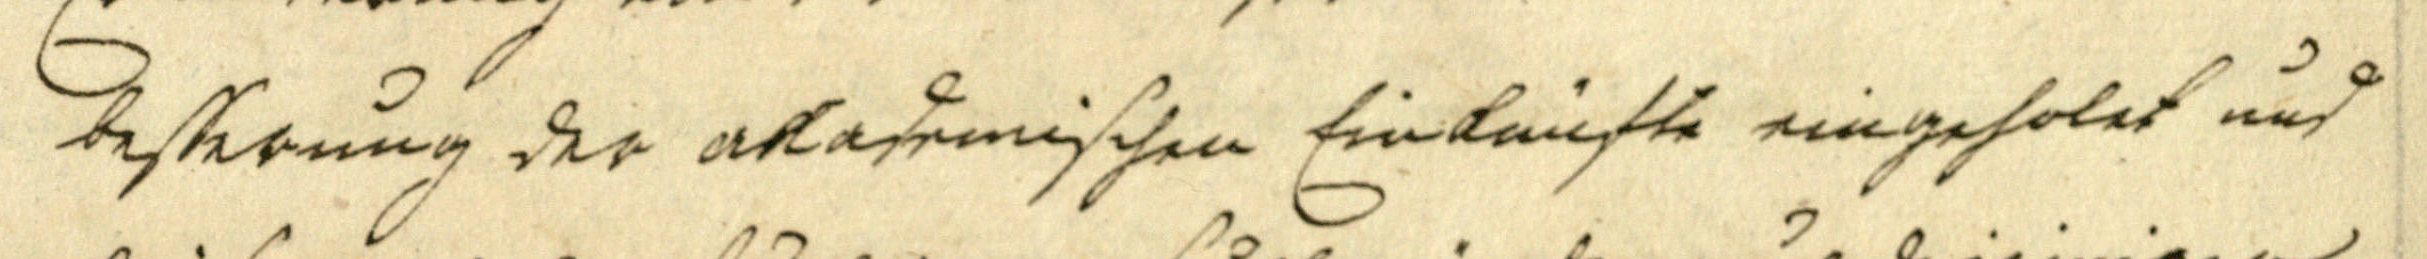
besserung der akademischen Einkünfte eingeholet und
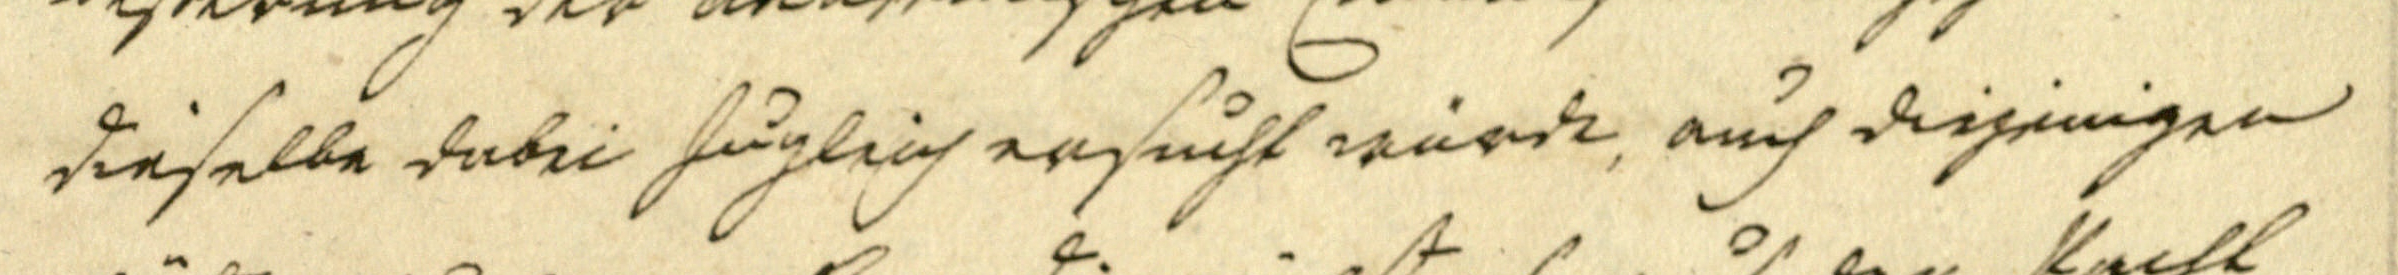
dieselbe dabei zugleich ersucht würde, auch diejenigen
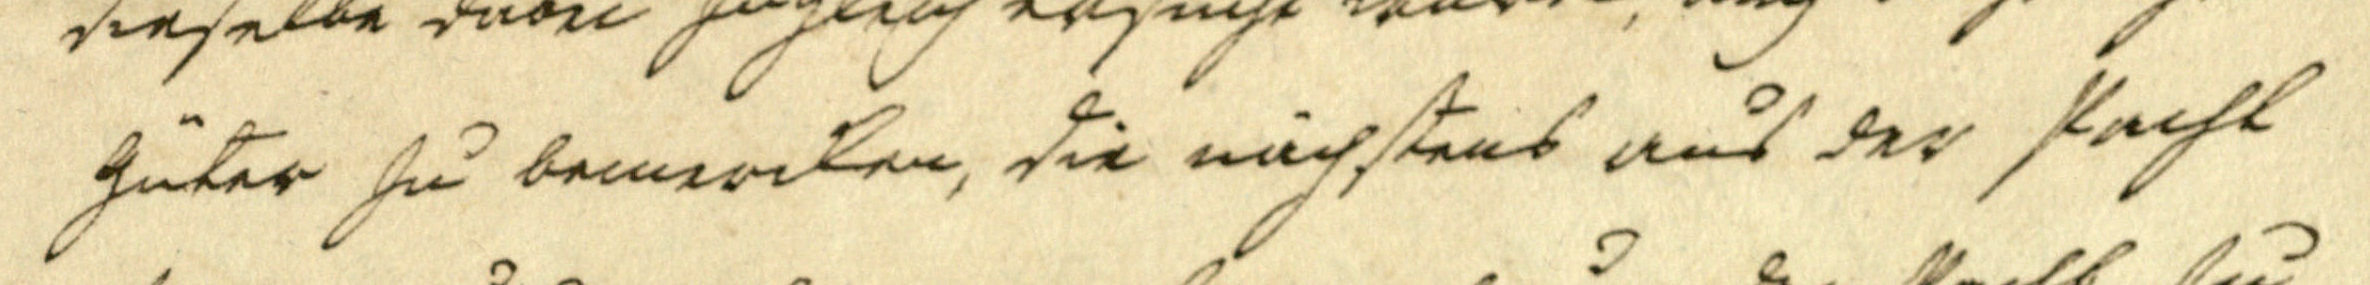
Güter zu bemercken, die nächstens aus der Pacht
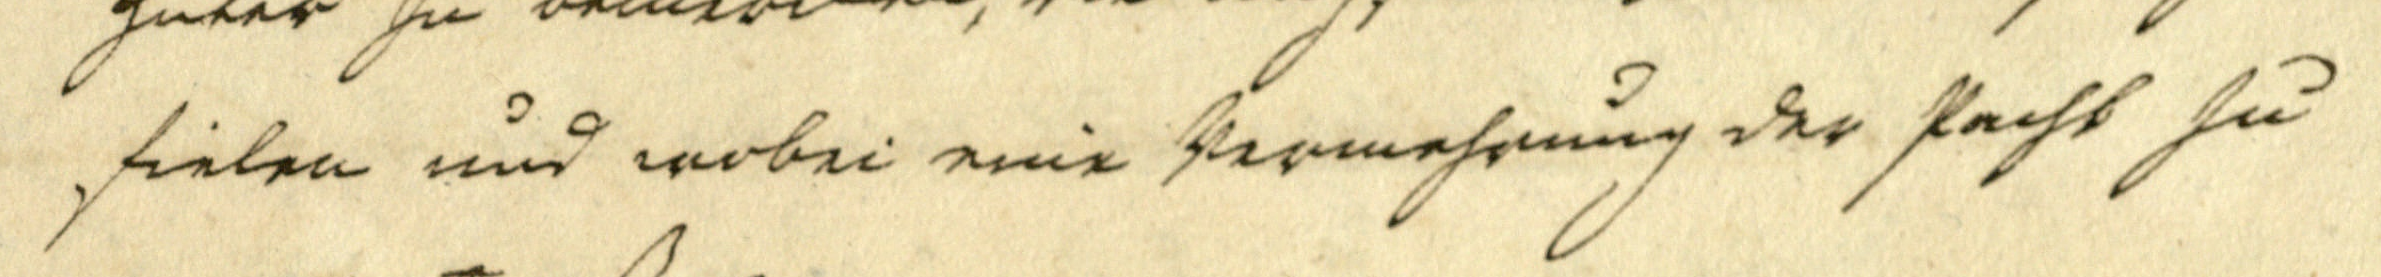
fielen und wobei eine Vermehrung der Pacht zu
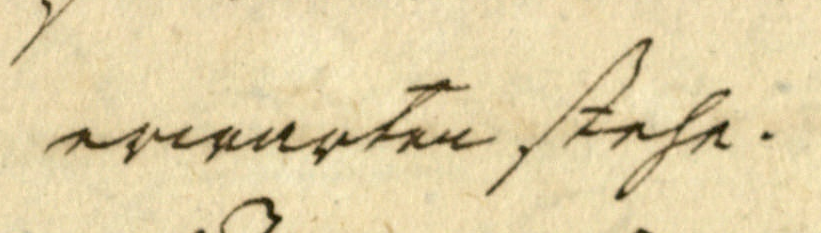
erwarten stehe.
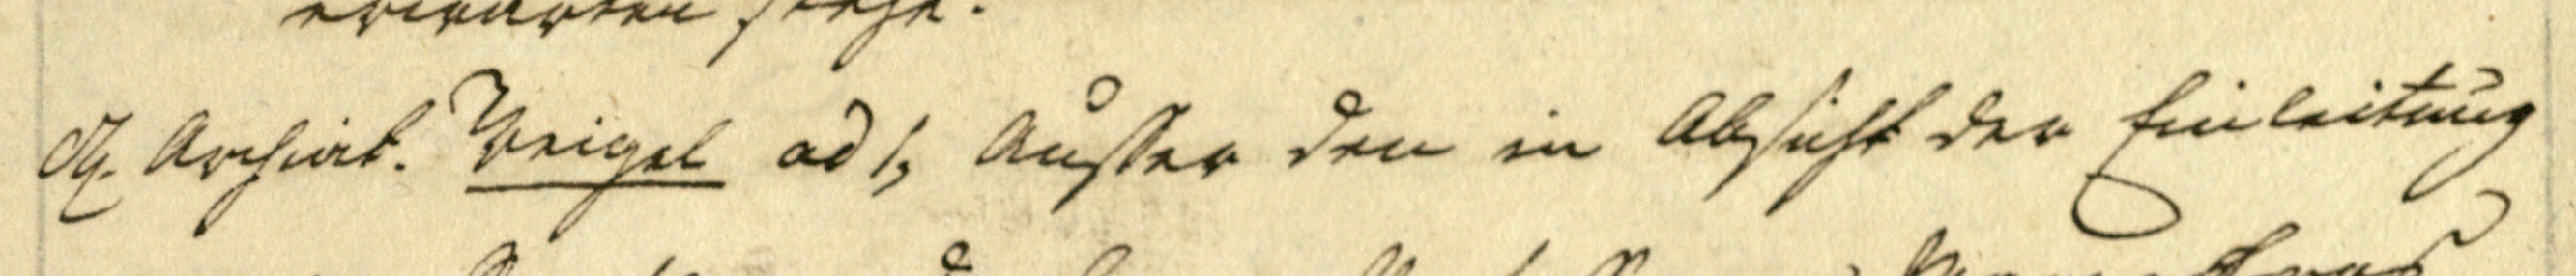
dh. Archiat. Weigel ad 1, Ausser dem in Absicht der Einleitung
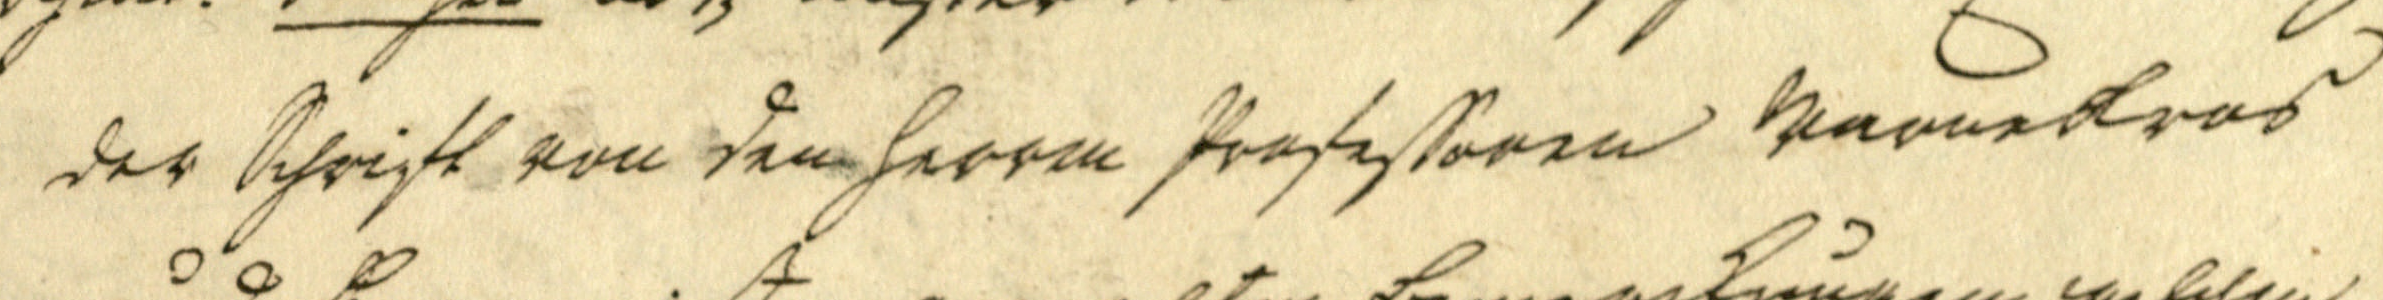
der Schrift von den Herrn Professoren Warnekros
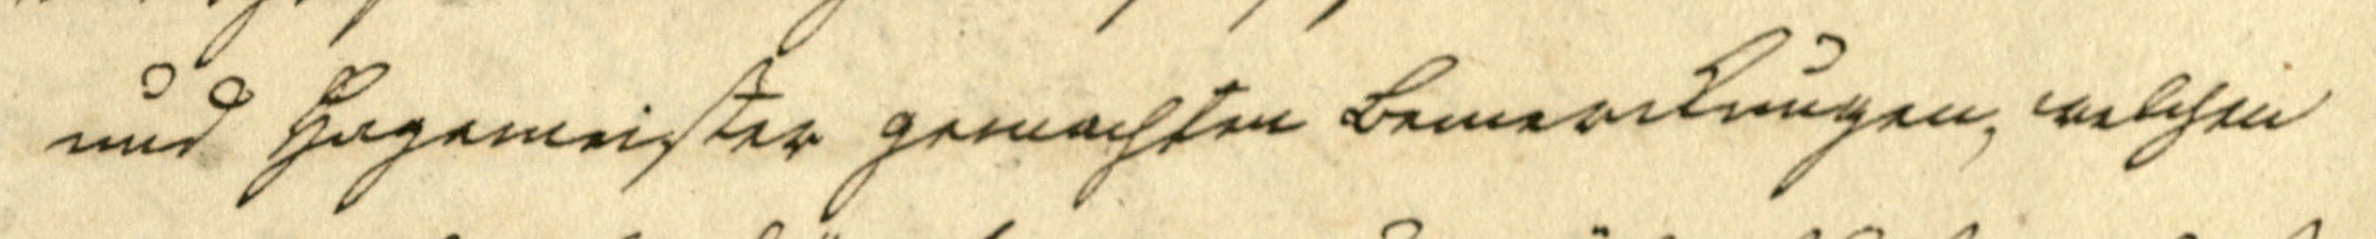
und Hagemeister gemachten Bemerckungen, welchen
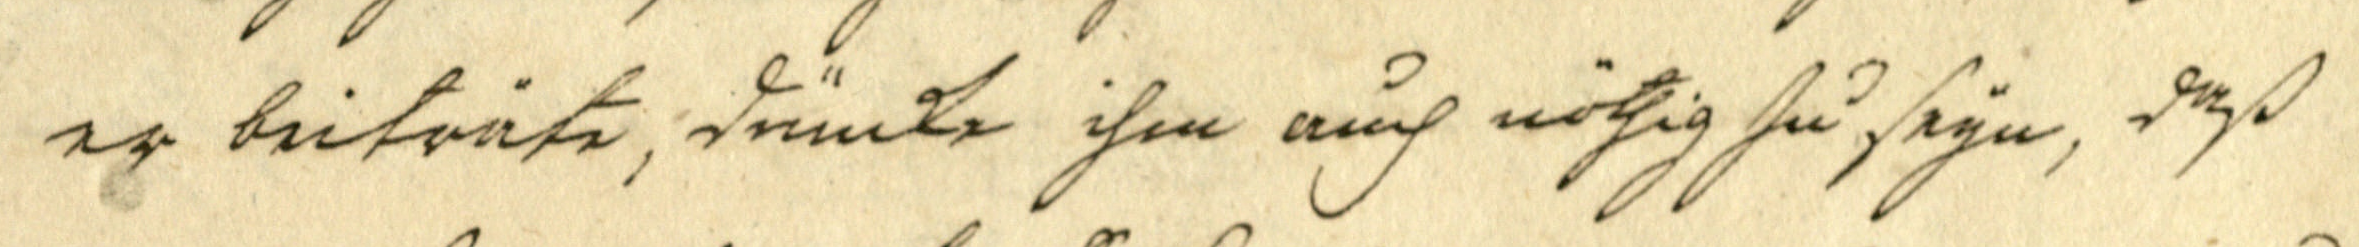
er beiträte, düncke ihm auch nöthig zu seÿn, daß
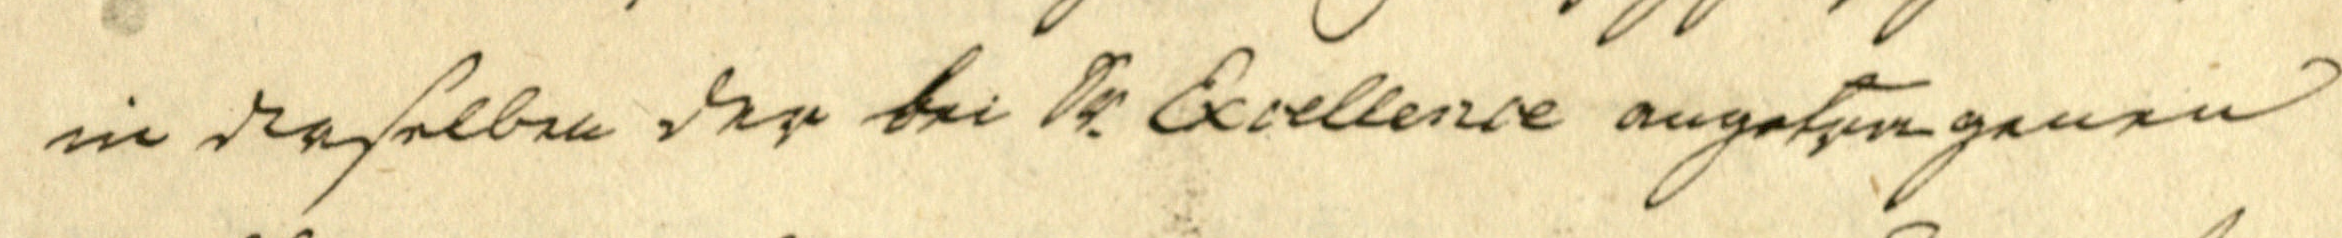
in derselben der bei Sr Excellence angetragenen
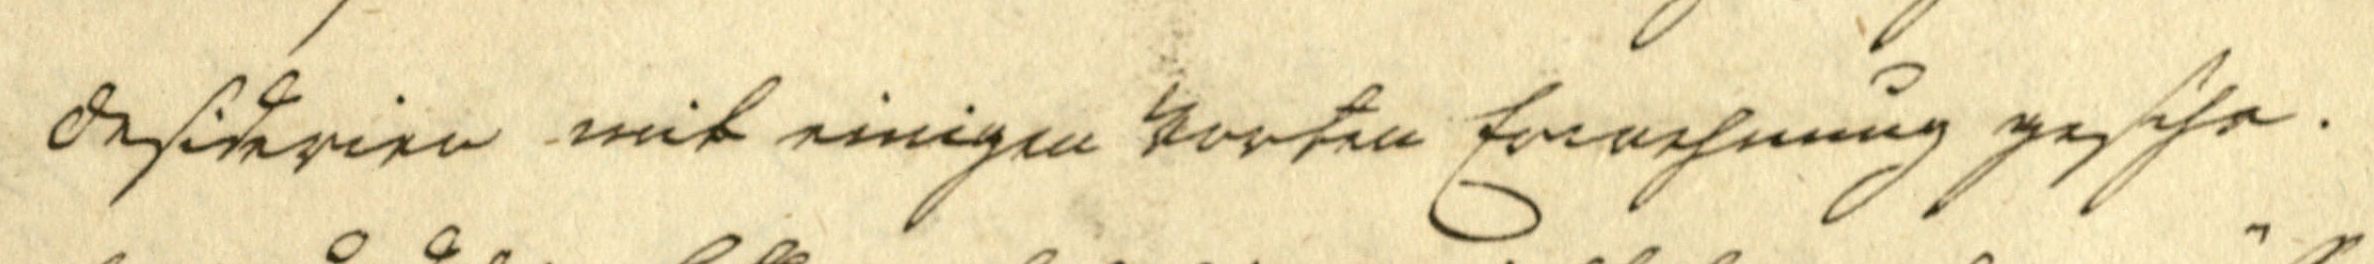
Desiderien mit einigen Worten Erwehnung gesche¬
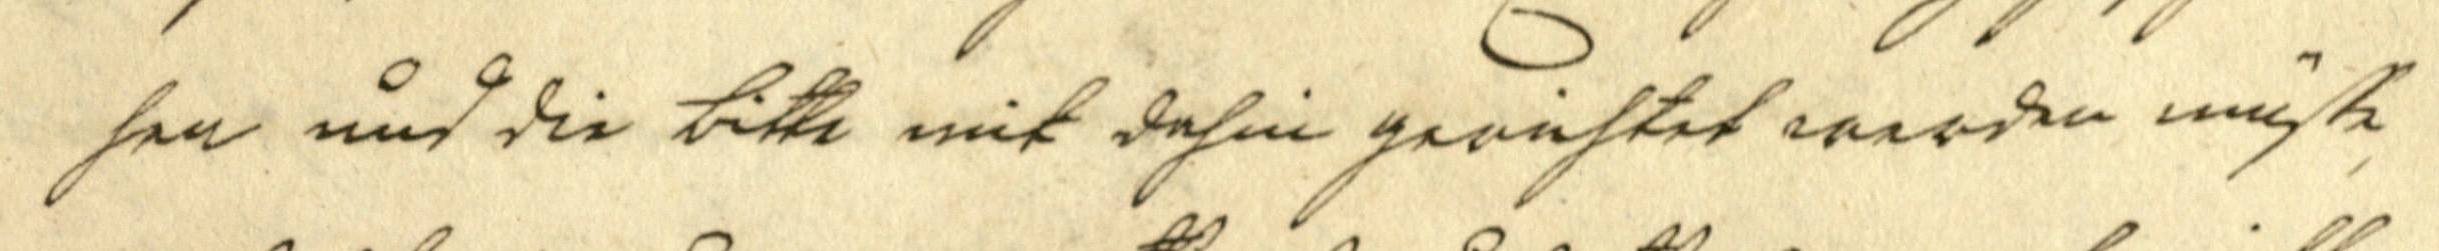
hen und die Bitte mit dahin gerichtet werden müsse,
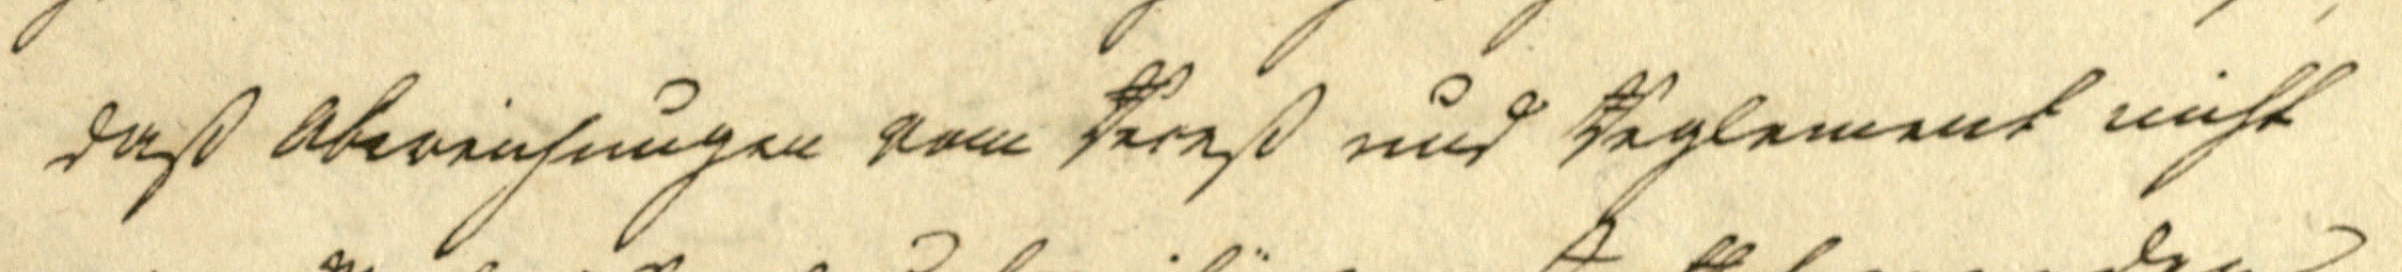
daß Abweichungen vom Receß und Reglement nicht
